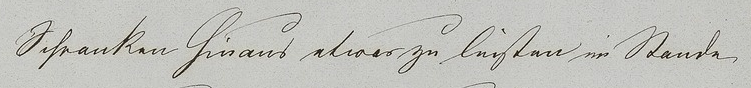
Schranken hinaus etwas zu leisten im Stande
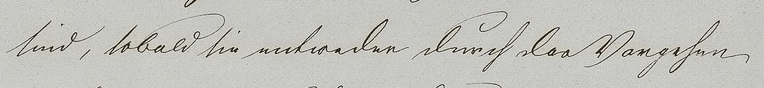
sind, sobald sie entweder durch das Vorgehen
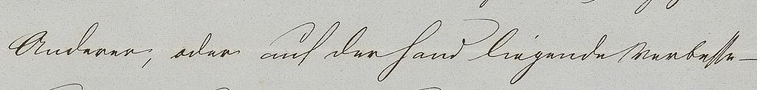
Anderer, oder auf der Hand liegende Verbesse-
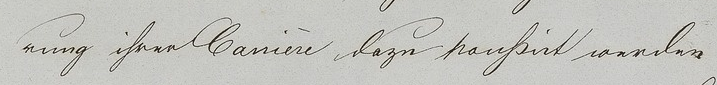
rung ihrer Carrière dazu poussirt werden.
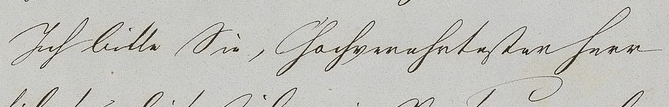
Ich bitte Sie, hochverehrtester Herr
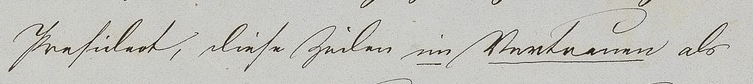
President, diese Zeilen im Vertrauen als
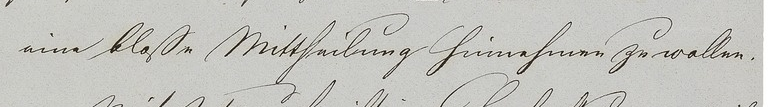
eine bloße Mittheilung hinnehmen zu wollen.
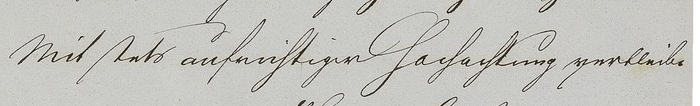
Mit stets aufrichtiger Hochachtung verbleibe
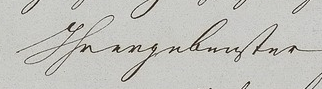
Ihr ergebenster
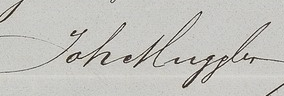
Joh. Muggler
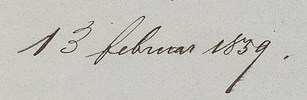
13 Februar 1859.
